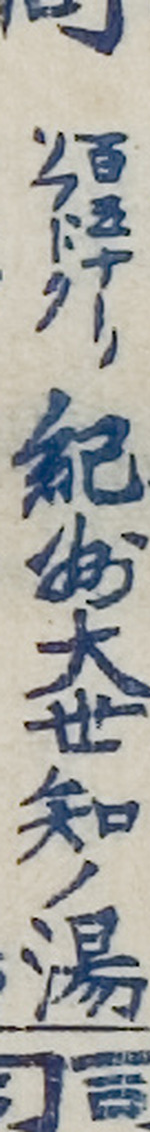同百五十リ紀州大世知之湯
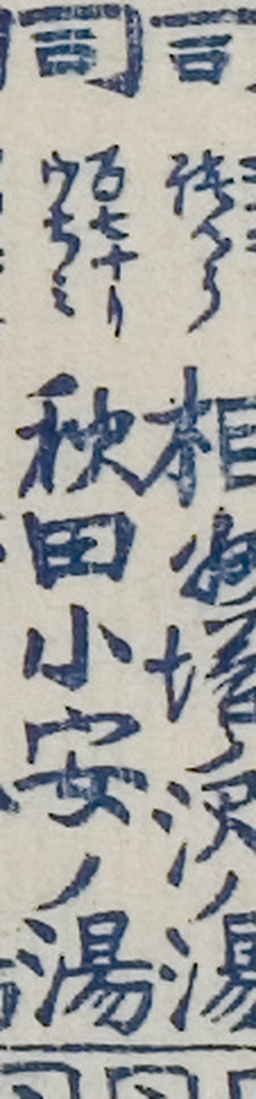同百七十リ秋田小安之湯
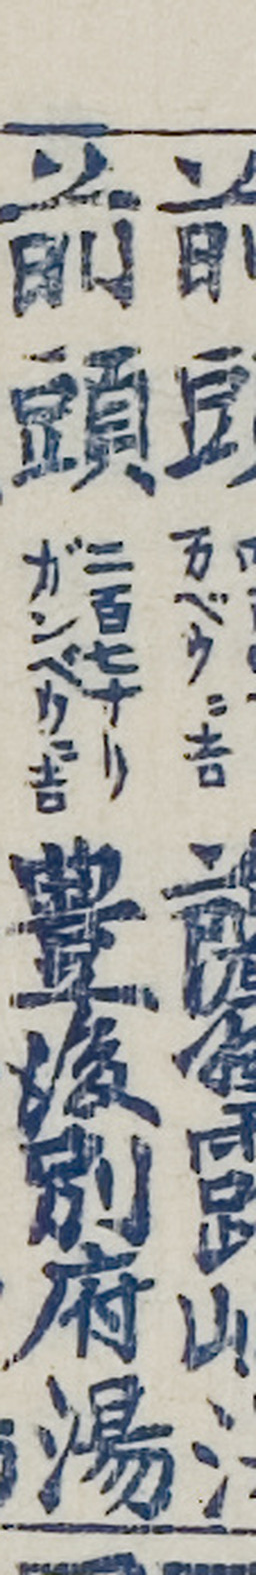前頭二百七十リ豊後別府之湯
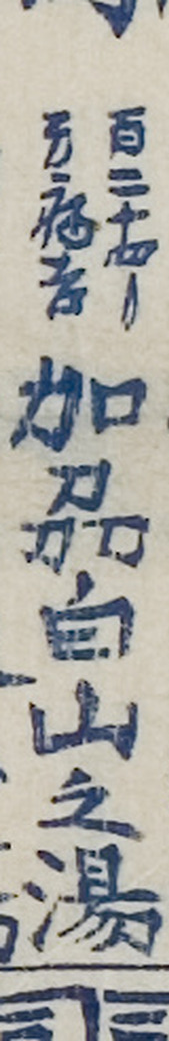同百九十四リ加州白山之湯
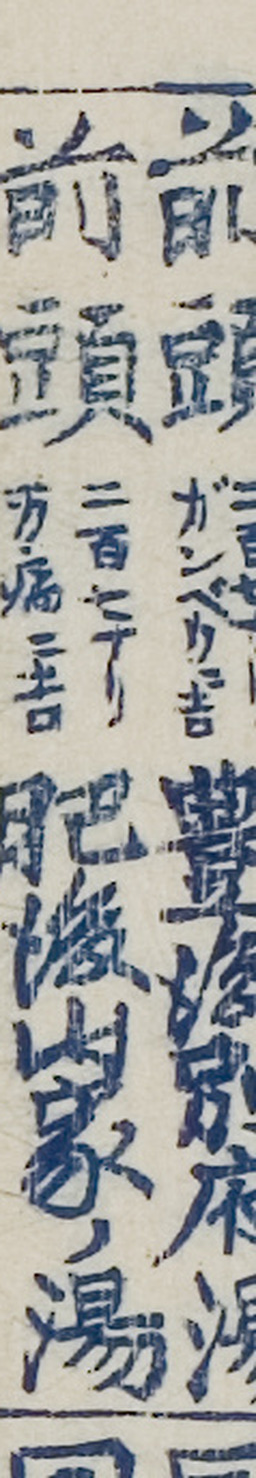前頭二百七十リ肥後山家之湯
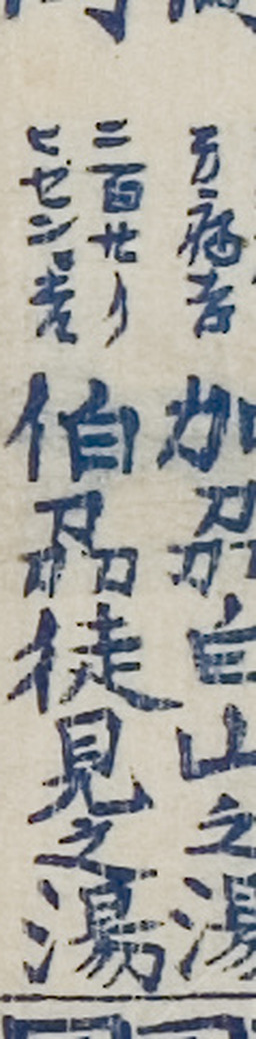同二百二十リ伯州徒見之湯
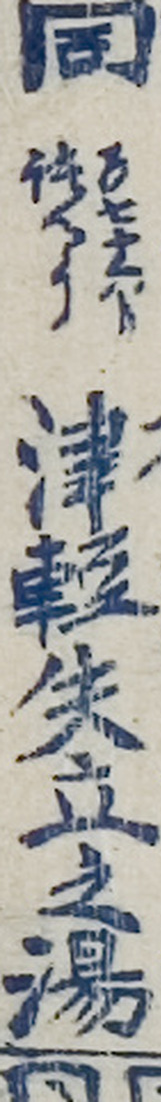同百七十六リ津軽矢立之湯
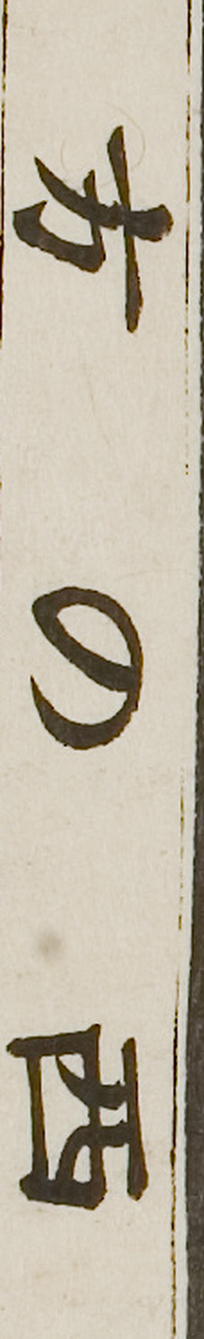西之方
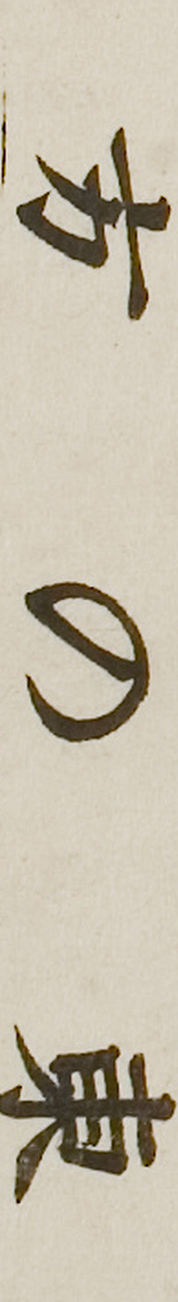東之方
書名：諸国温泉一覧
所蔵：東京大学総合図書館 General Library in the University of Tokyo, JAPAN
